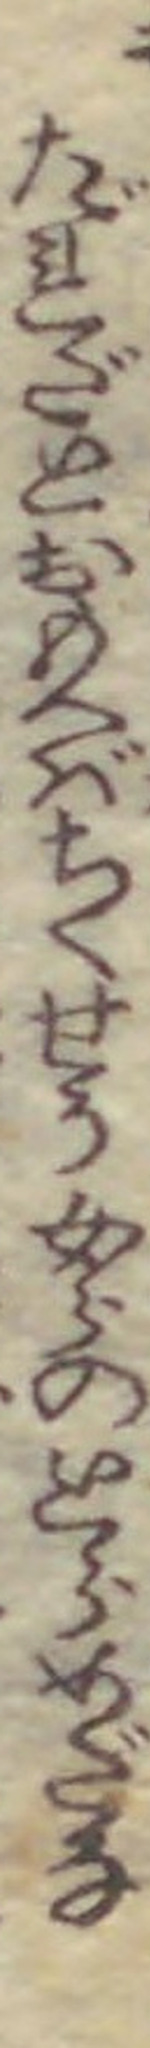だれだとおもへばちくせう女郎のとらめだな
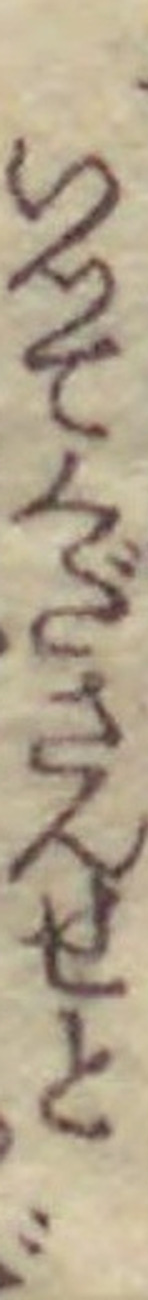いつてくださんせと
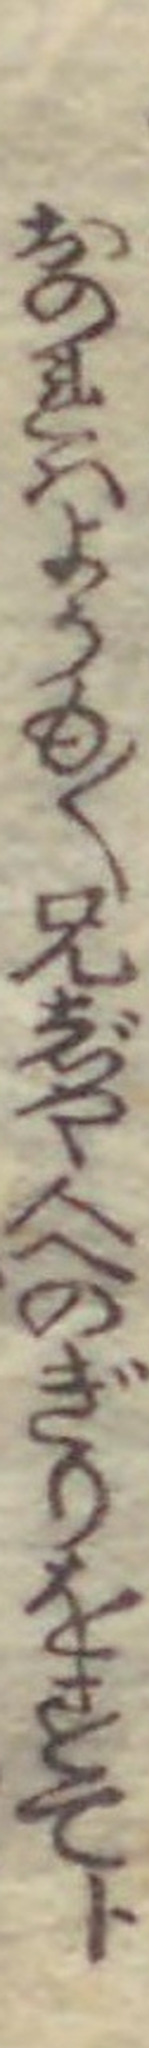おのれはようも〳〵兄じや人へのぎりをすてと
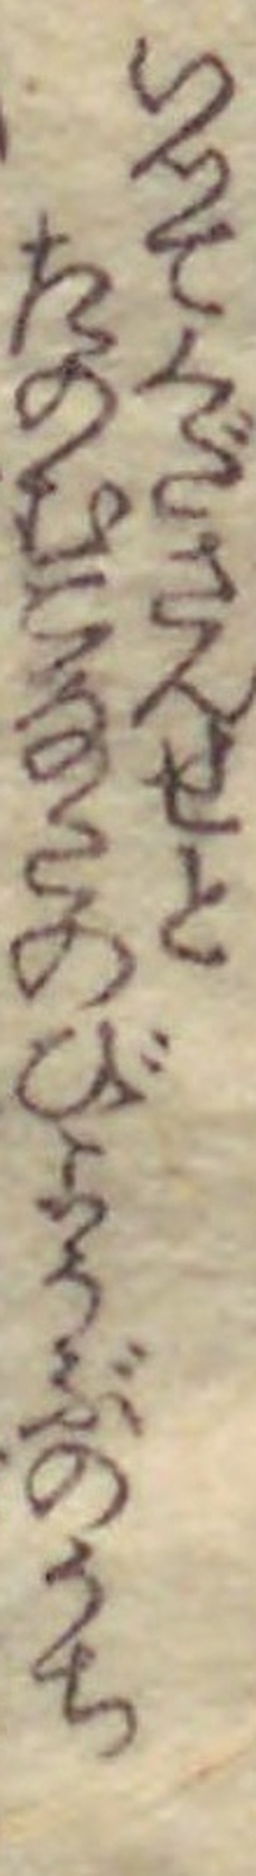たのむこなたのびようぶのうち
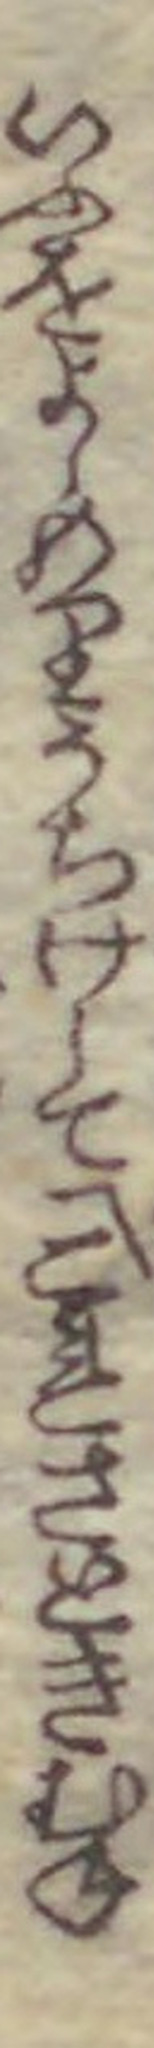いふをよしもりうちけして〽これさときむね
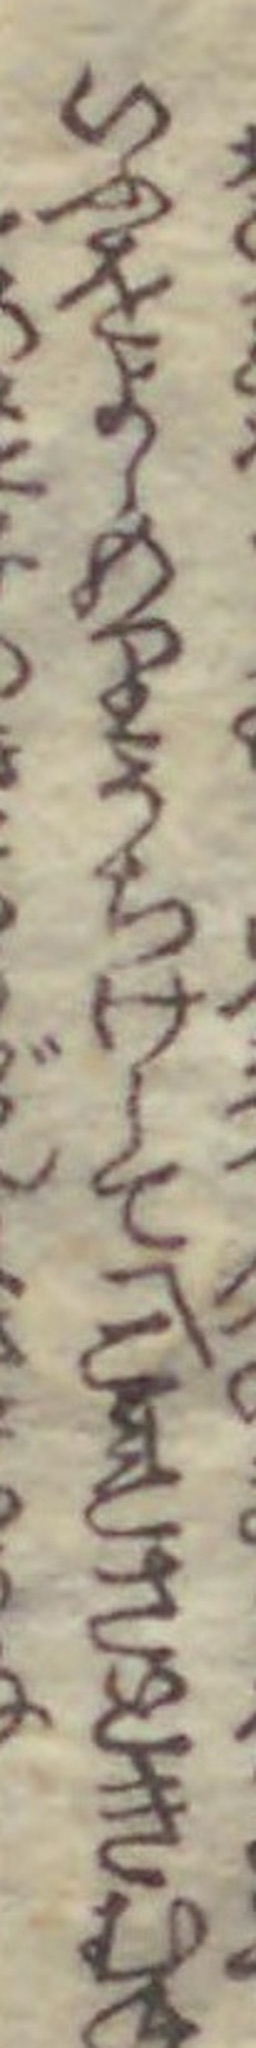いふをよしもりうちけして〽これさときむね
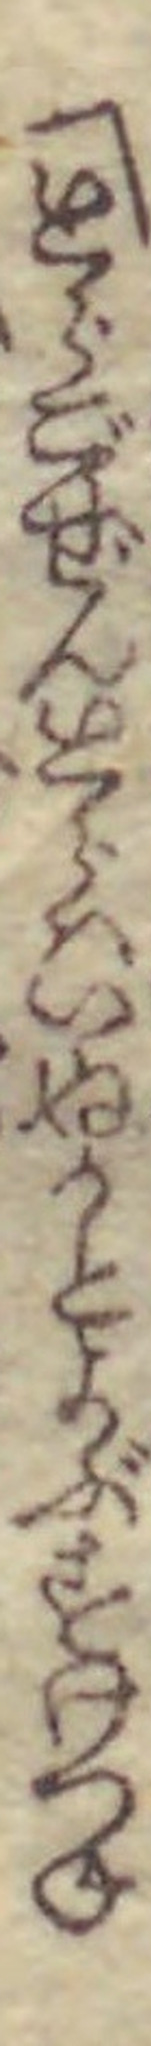〽とらごぜんとらはいぬかとよぶすけつね
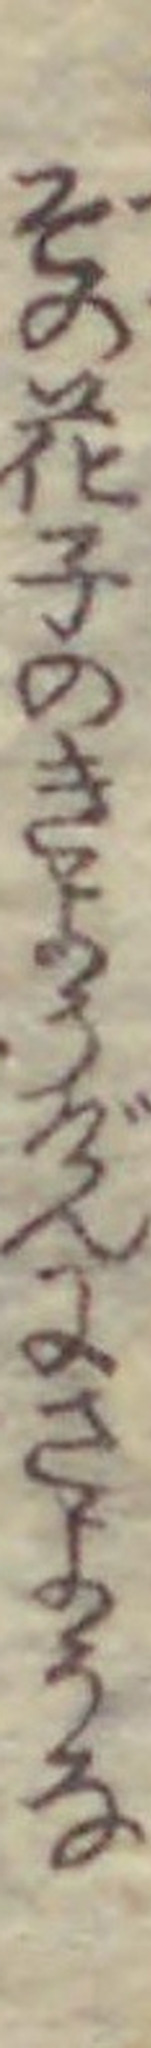その花子のきようげんにさような
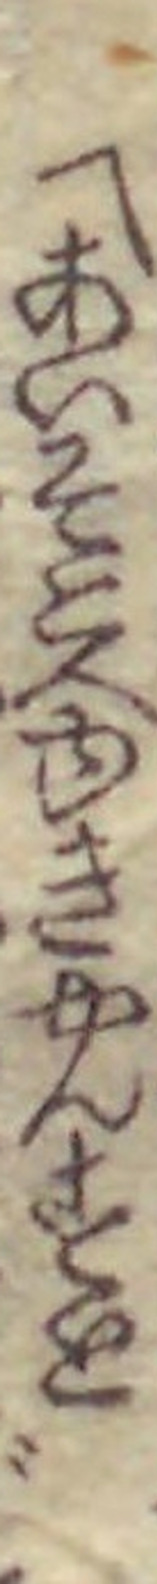〽あいそこへゆきやんすと
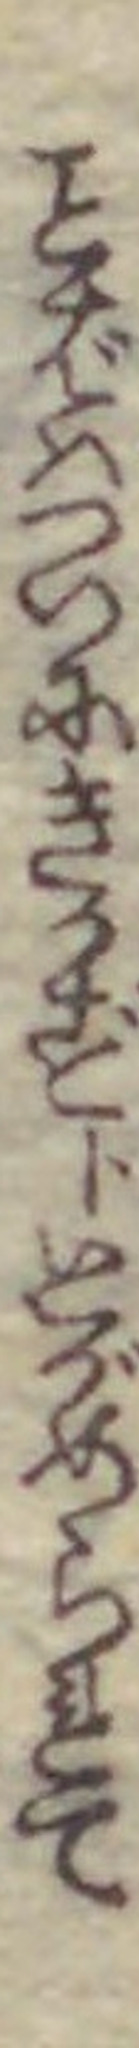ことばはついにきかずととがめられて
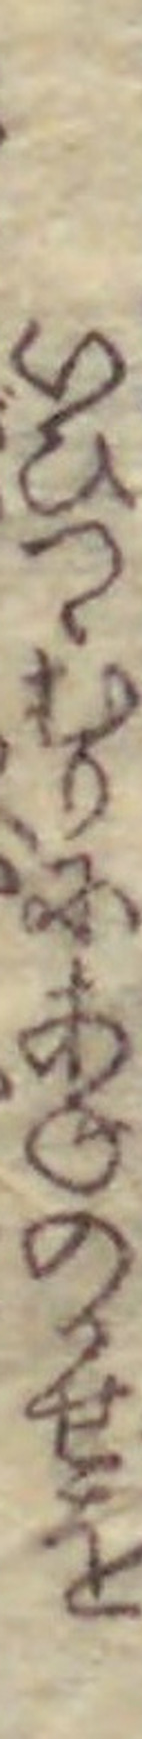いひつゝむりにあねのかぜを
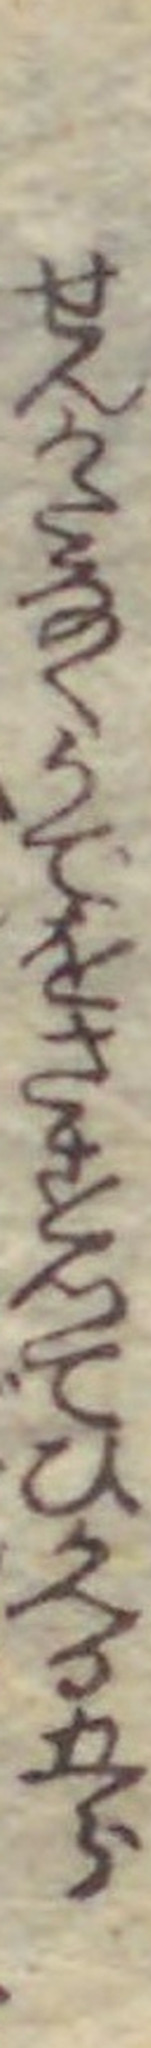せんかたなくうでをさすつてひかへる五郎
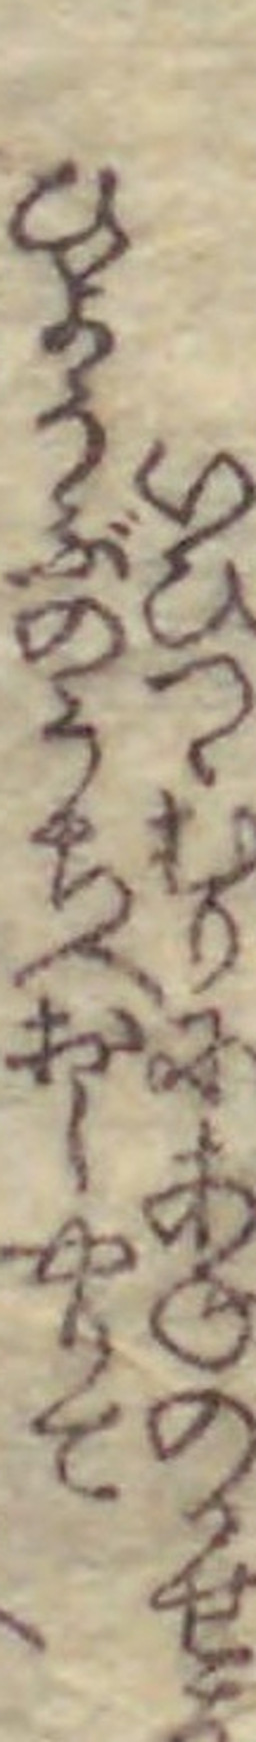ひようぶのうちへおしやりて
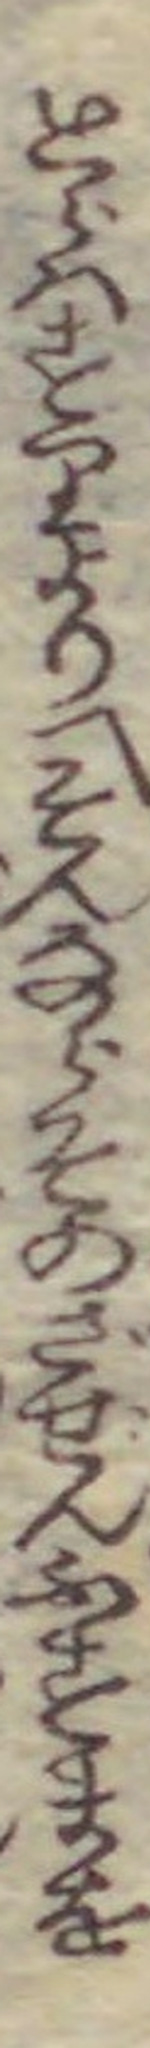とらはすりより〽そんならそのざぜんふすまを
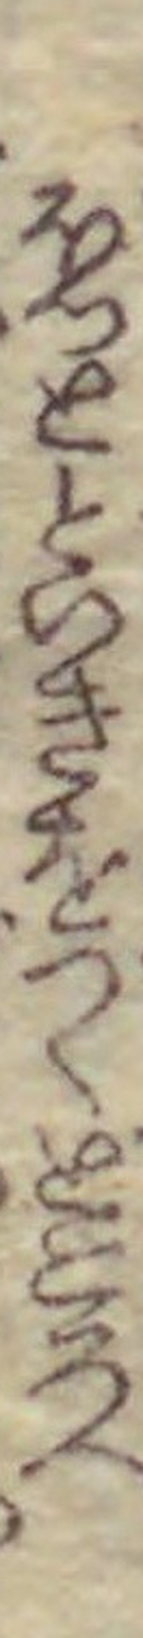ほつとといきをつくところへ
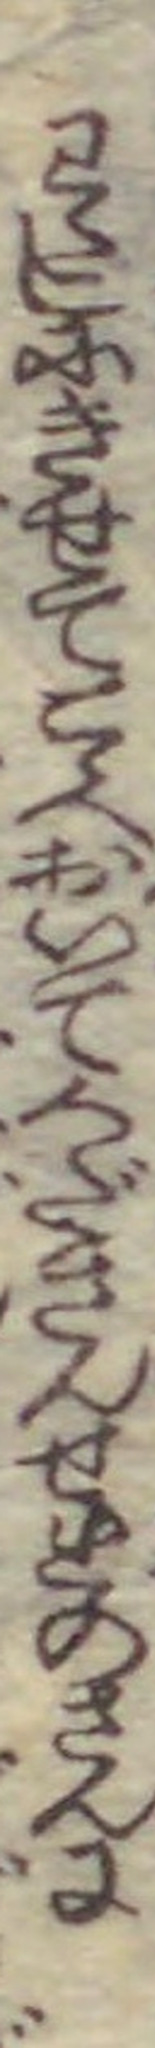わたしにきせてこゝへおいてくださんせとのさんに
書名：大時代唐土化物 3巻. 曽我太夫染
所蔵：国立国会図書館 National Diet Library, JAPAN
